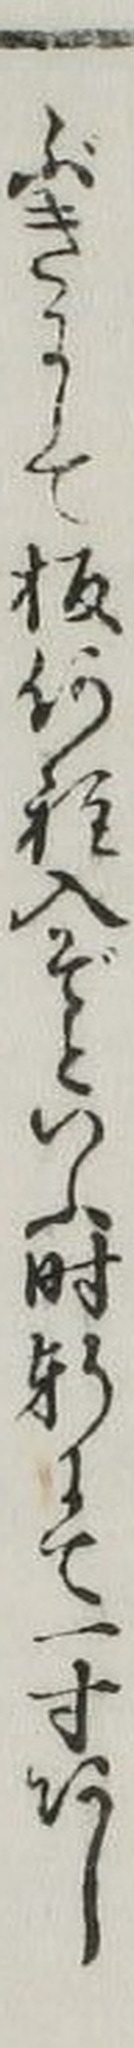ぶきにして板何程入ぞといふ時軒にて一寸あし
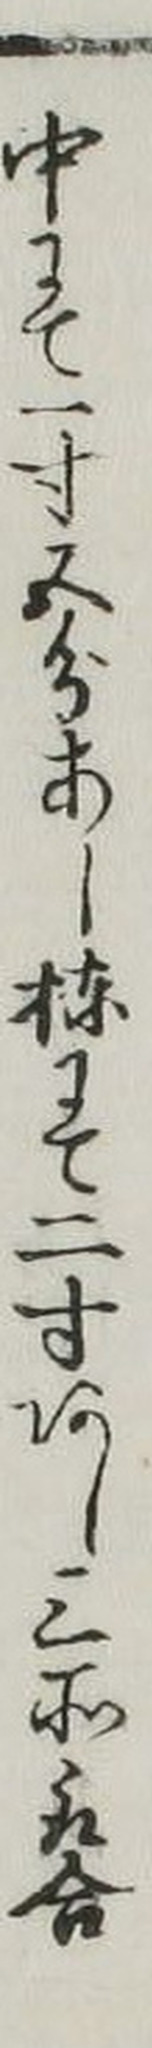中にて一寸五分あし棟にて二寸あし三所取合
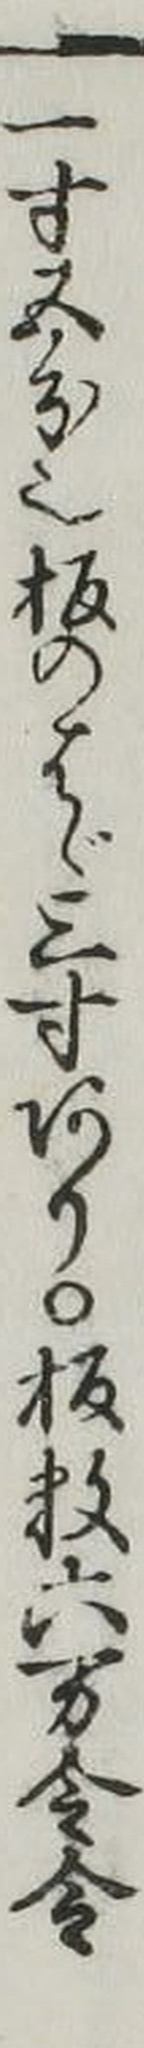一寸五分也板のはゞ三寸あり○板数六万令令
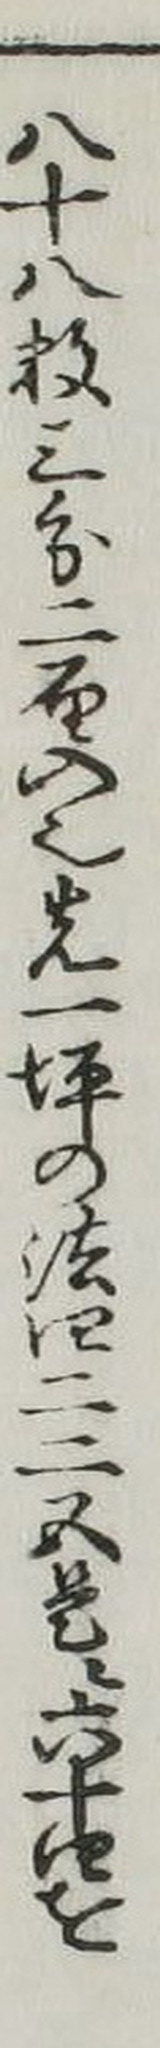八十八数三分二厘入也先一坪の法四二二五是に六十四を
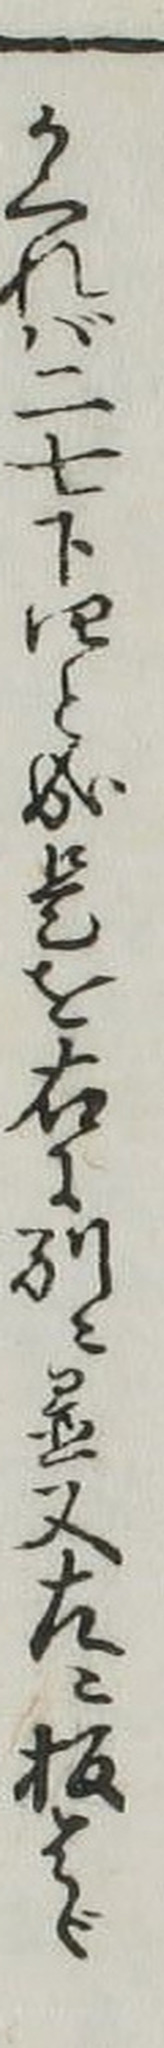かくれば二七下四と成是を右に別に置又左に板はゞ
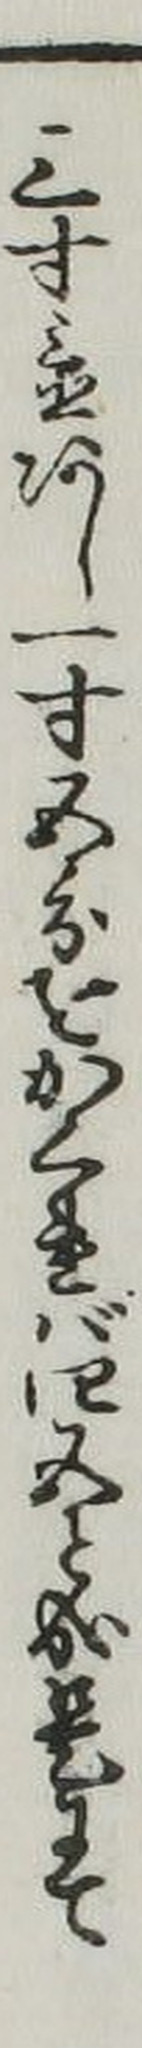三寸置あし一寸五分をかくれば四五と成是にて
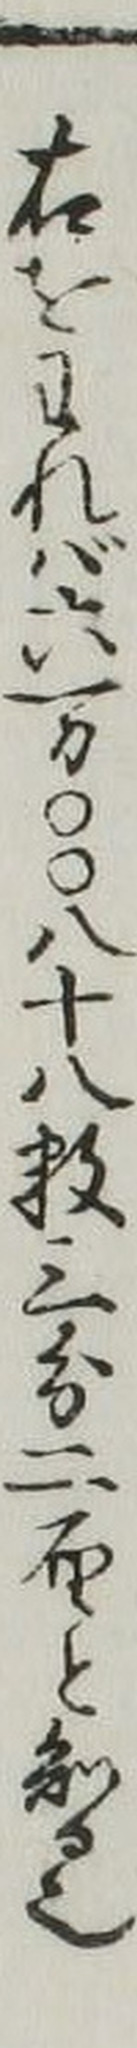右をわれば六万〇〇八十八数三分二厘と知る也
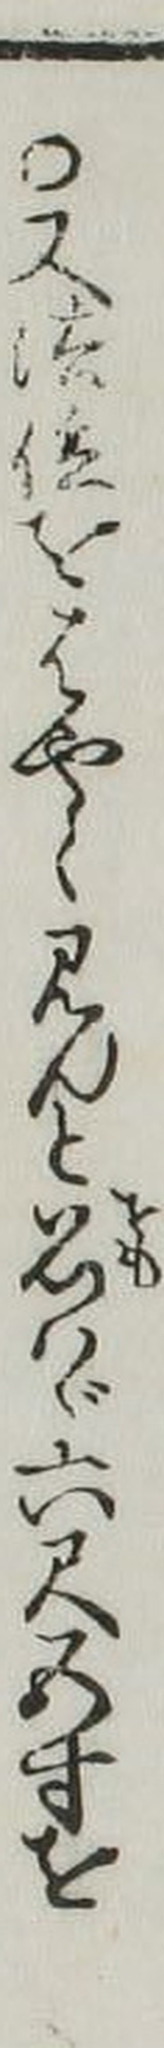○又法位をはやく見んと思はゞ六尺五寸を
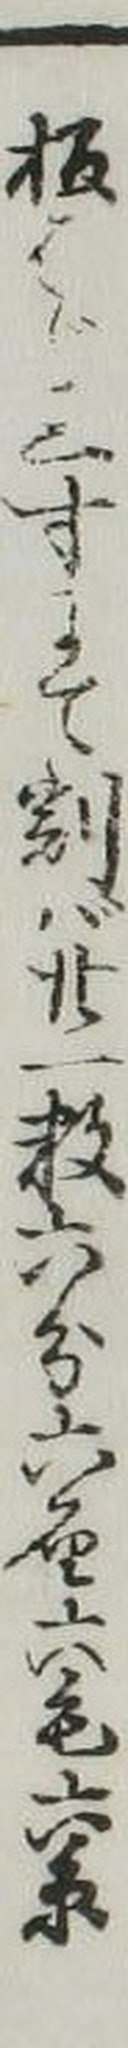板はゞ三寸にて割ば廿一数六分六厘六毛六糸
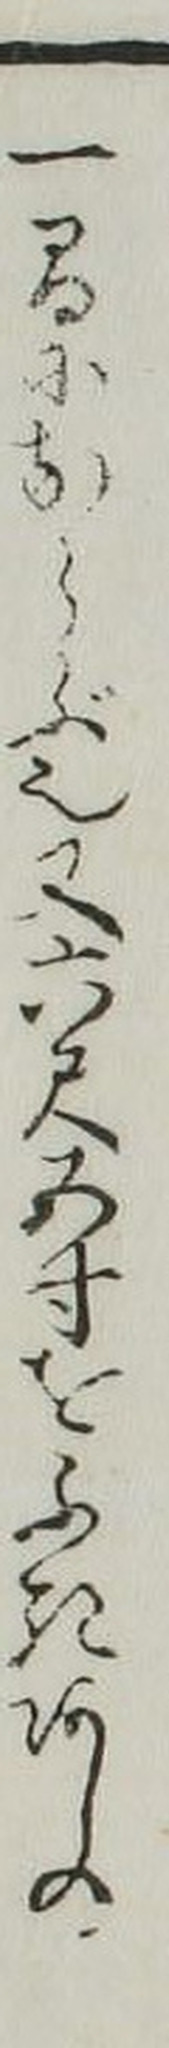一間にならぶ也六尺五寸をふきあしの
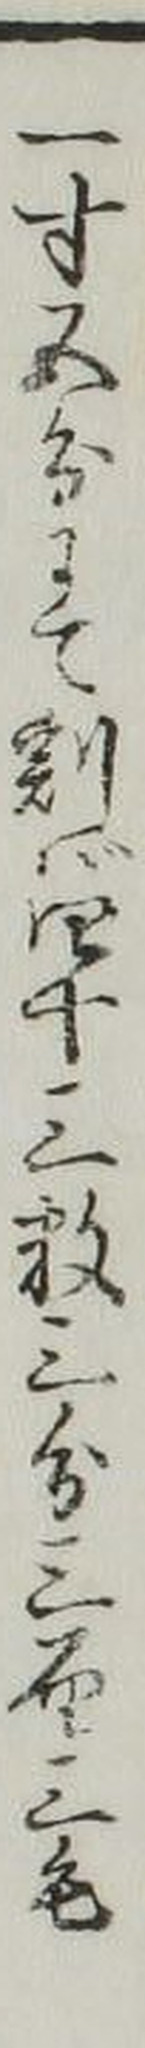一寸五分にて割ば四十三数三分三厘三毛
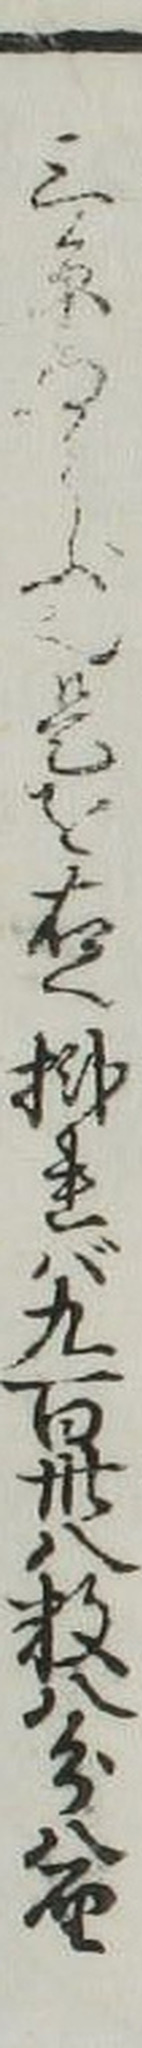三糸ならぶ也是を右へ掛れば九百卅八数八分八厘
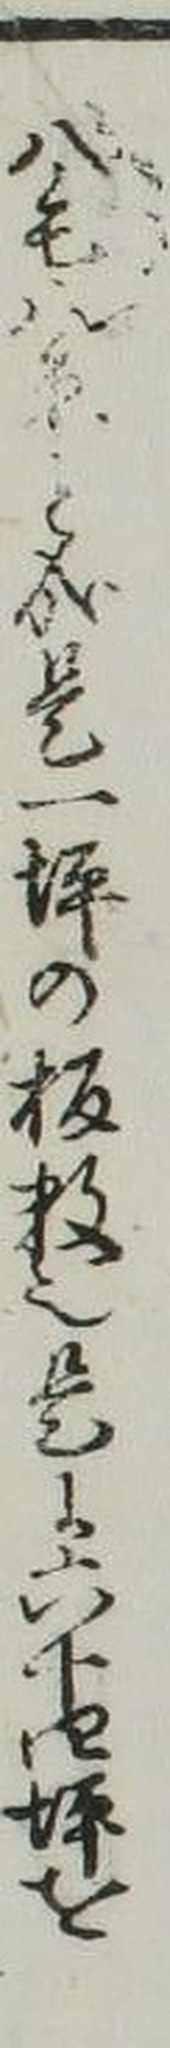八毛八糸と成是一坪の板数也是に六十四坪を
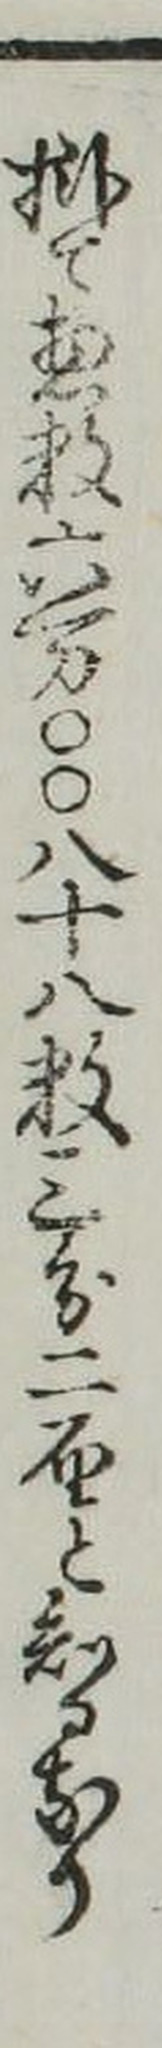掛て惣数六万〇〇八十八数三分二厘と知るなり

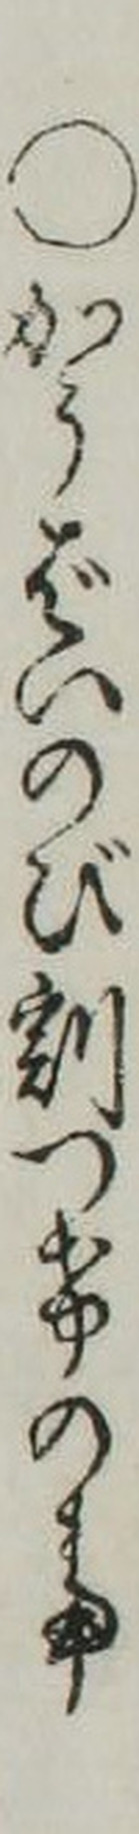○かうばいのび割つけの事
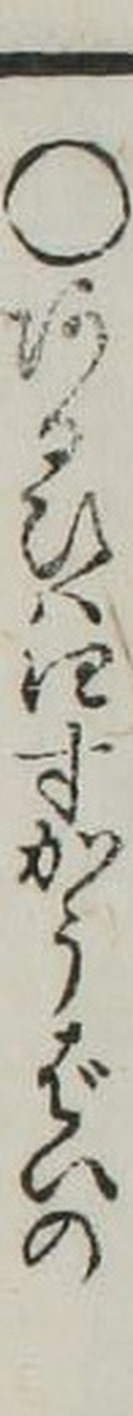○あるひは四寸かうばいの
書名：宝玉塵劫記
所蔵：東京学芸大学教育コンテンツアーカイブ
